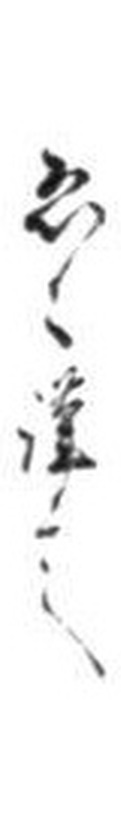恐々謹言
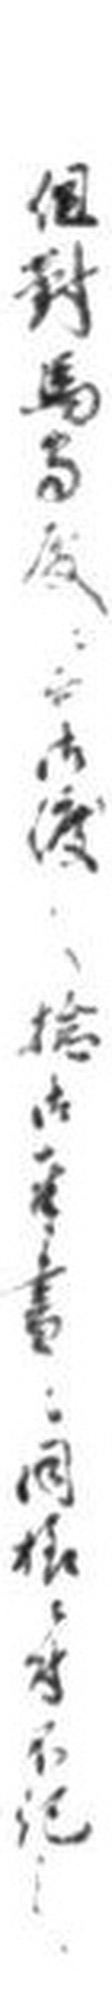但対馬守殿ニ而御渡之捻御奉書と同様ニ付不記之
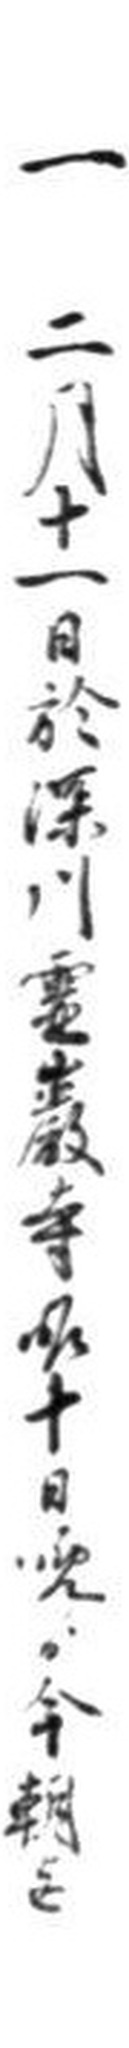一二月十一日於深川霊巖寺昨十日晩ゟ今朝迄
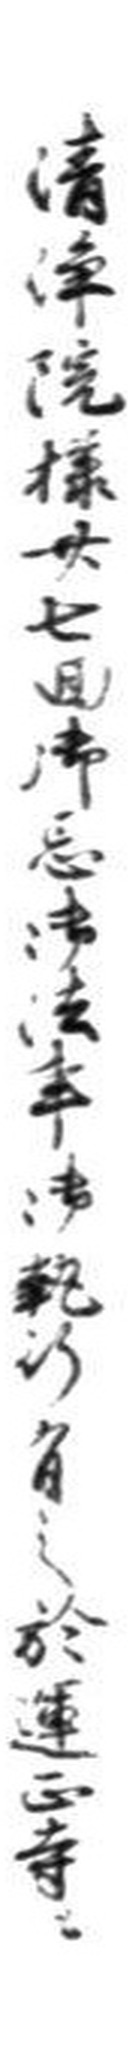清浄院様廿七回御忌御法事御執行有之於運正寺ニ
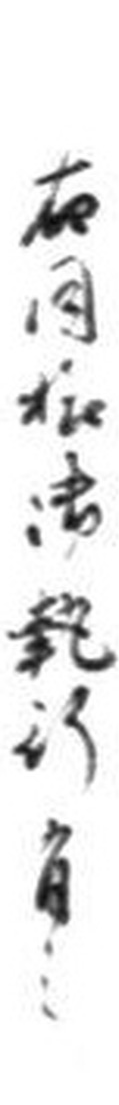右同様御執行有之
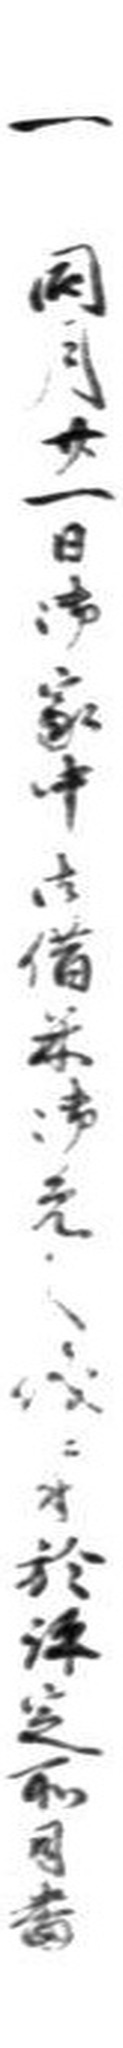一同月廿一日御家中御借米御免之儀ニ付於評定所月番
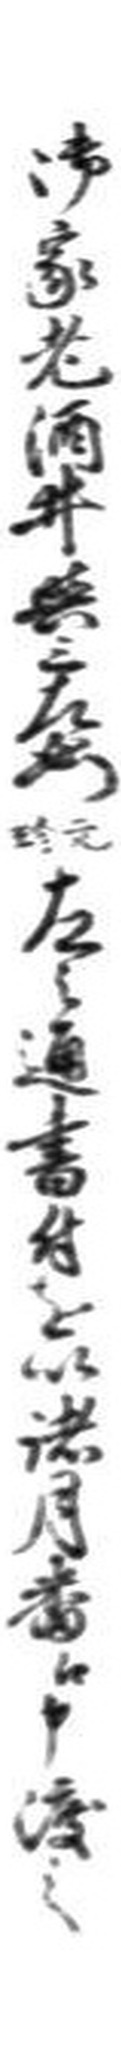御家老酒井與三左衛門文珍左之通書付を以諸月番江申渡之
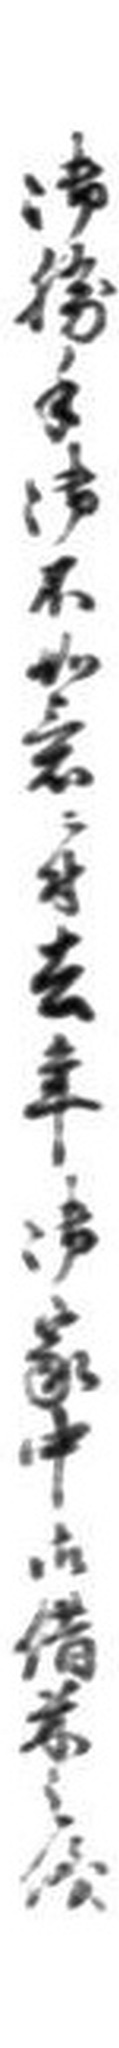御勝手御不如意ニ付去年御家中江御借米之儀
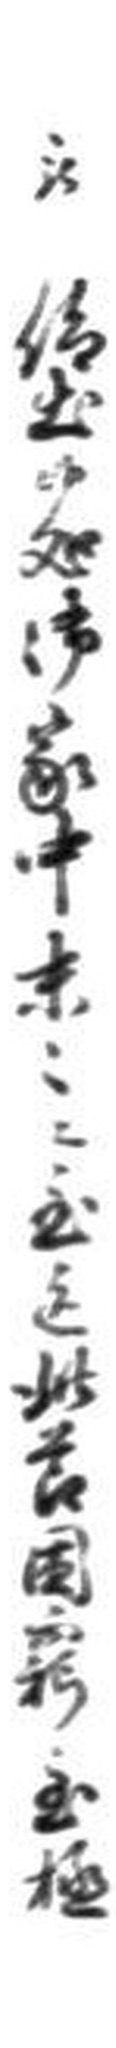被仰出候処御家中末々ニ至迄此節困窮至極
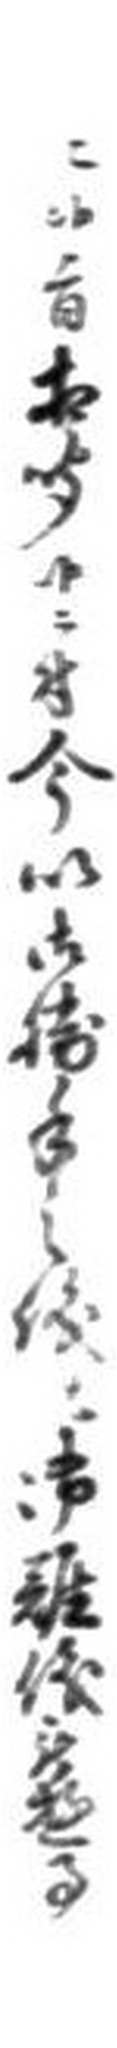ニ候旨相聞候ニ付今以御勝手之儀は御難儀被遊事
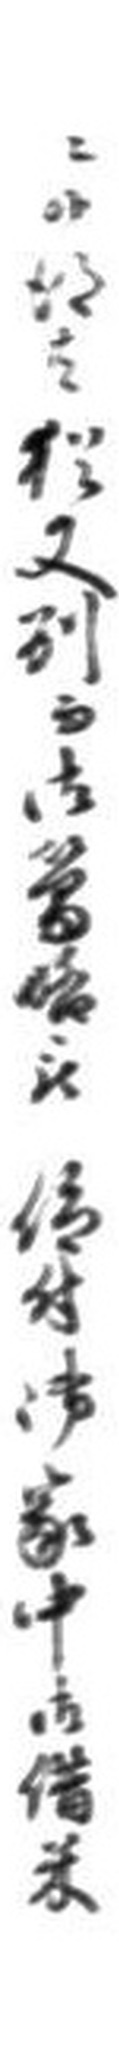ニ候得共猶又別而御簡略被仰付御家中御借米
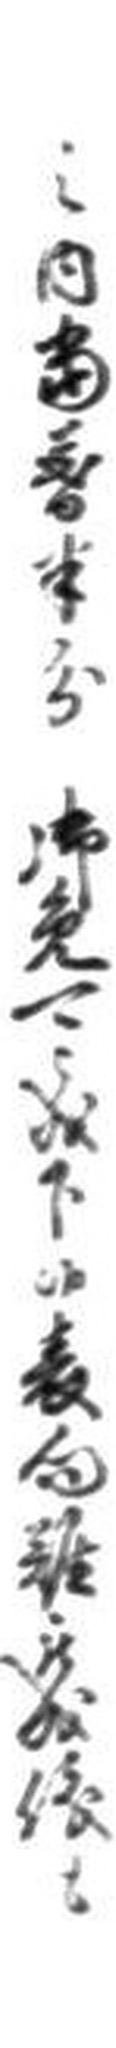之内当暮半分御免可被成下候表向難被成儀も
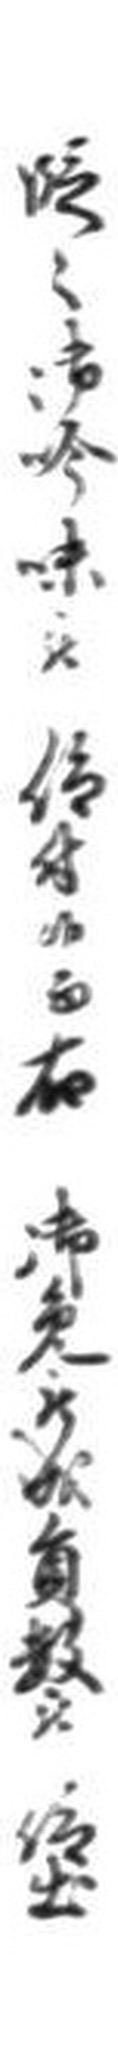段々御吟味被仰付候而右御免被成員数被仰出
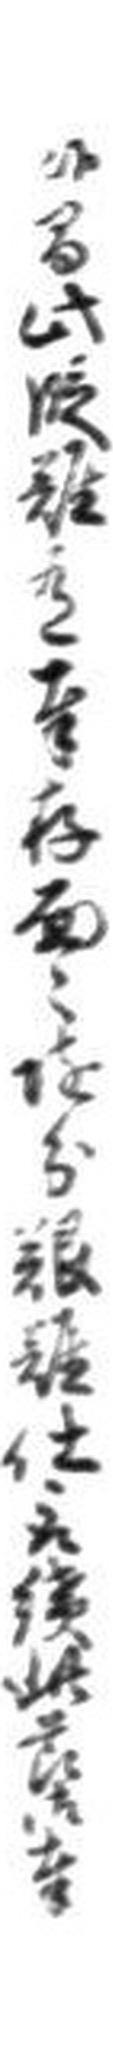候間此段難有奉存面々随分艱難仕取続此節御奉
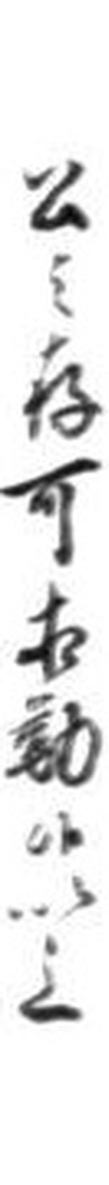公と存可相勤候以上

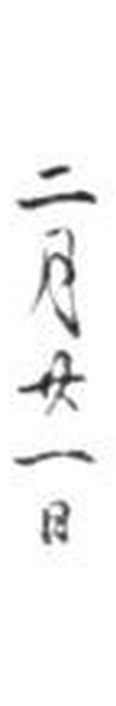二月廿一日
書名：家譜 三十九 宗矩公 享保十年
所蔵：福井県文書館 Fukui Prefectural Archives
